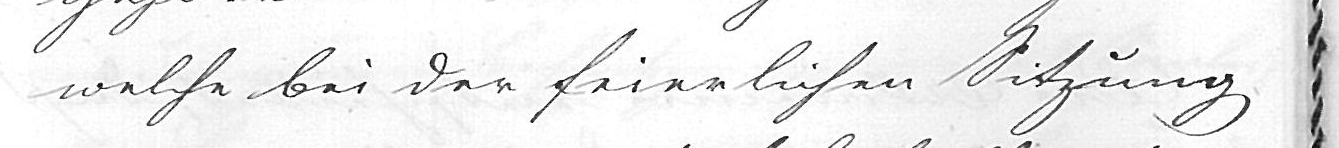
welche bei der feierlichen Sitzung
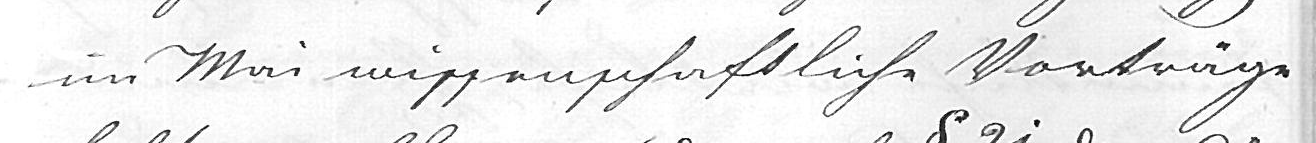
im Mai wissenschaftliche Vorträge
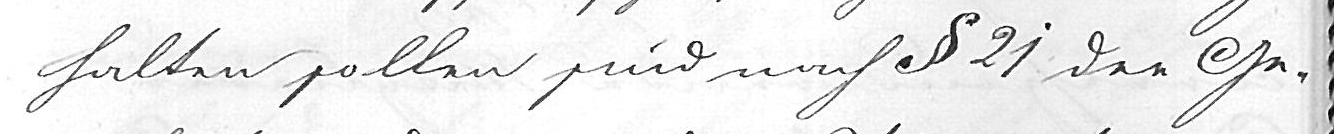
halten sollen und nach § 21 der Ge-
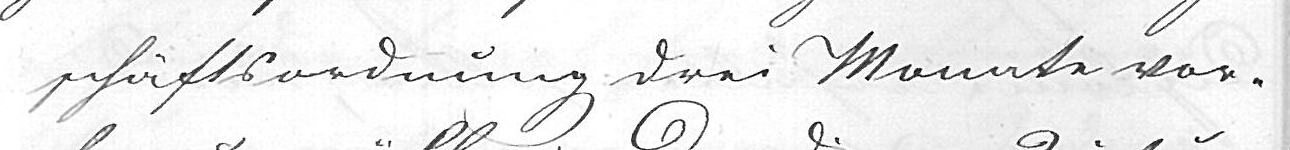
schäftsordnung drei Monaten vor-
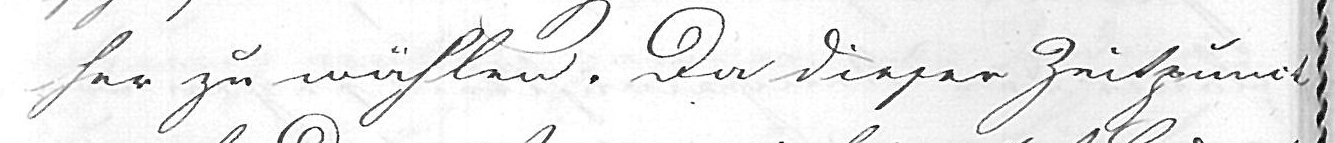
her zu wählen. Da dieser Zeitpunct
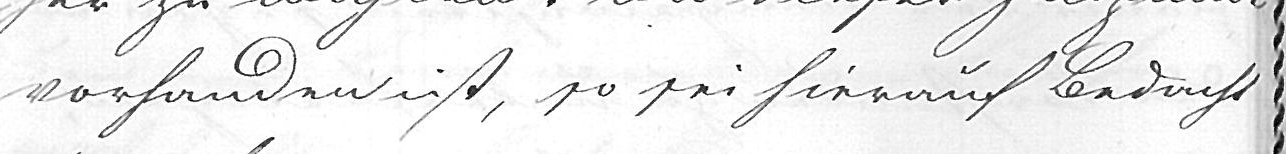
vorhanden ist, so sei hierauf Bedacht
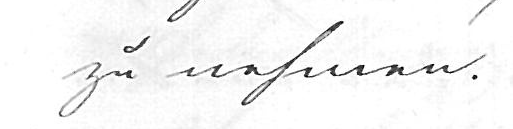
zu nehmen.
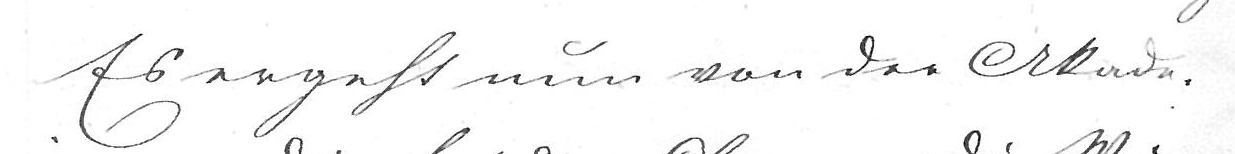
Es ergeht nun von der Akade-
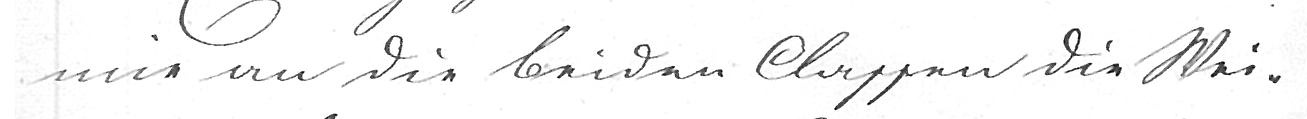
mie an die beiden Classen die Wei-
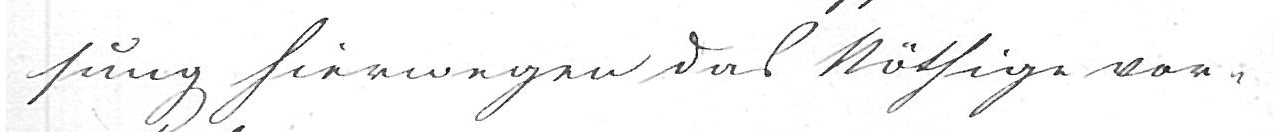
sung hierwegen das Nöthige vor-
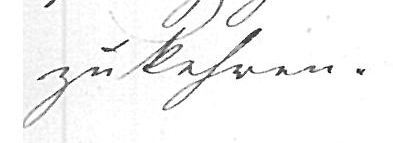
zukehren.
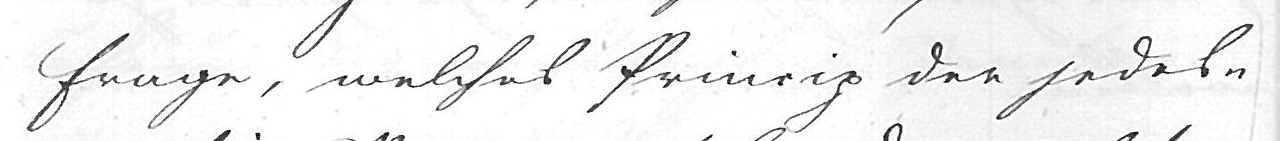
Frage, welches Princip der jedes-
